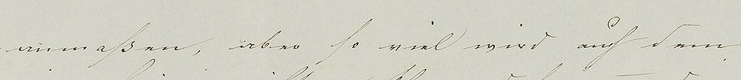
anmaßen, aber so viel wird auch dem
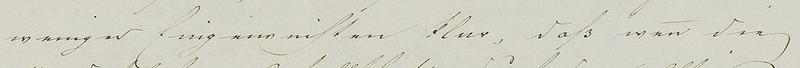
weniger Eingeweihten klar, daß wenn die
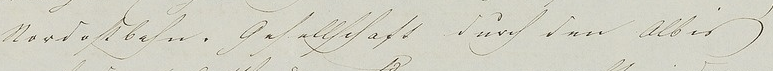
Nordostbahn-Gesellschaft durch den Albis
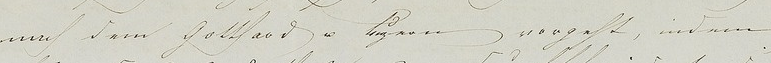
nach dem Gotthard & Luzern vorgeht, indem
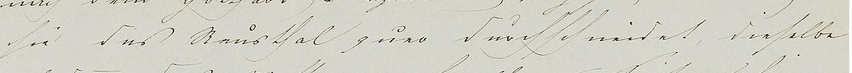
sie das Reusthal quer durchschneidet, dieselbe
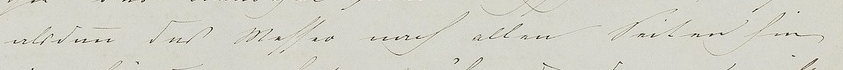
alsdann das Messer nach allen Seiten hin
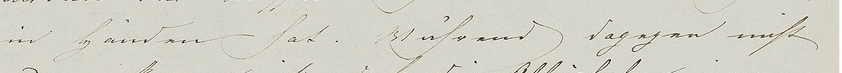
in Händen hat. Während dagegen nicht
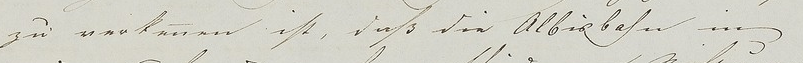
zu verkennen ist, daß die Albisbahn in
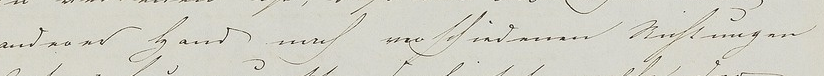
anderer Hand nach verschiedenen Richtungen
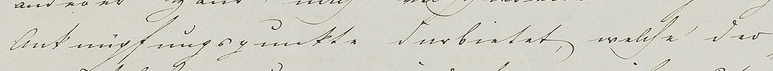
Anknüpfungspunkte darbietet, welche der
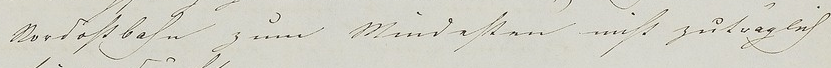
Nordostbahn zum Mindesten nicht zuträglich
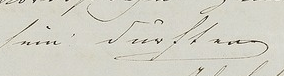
sein dürften.
